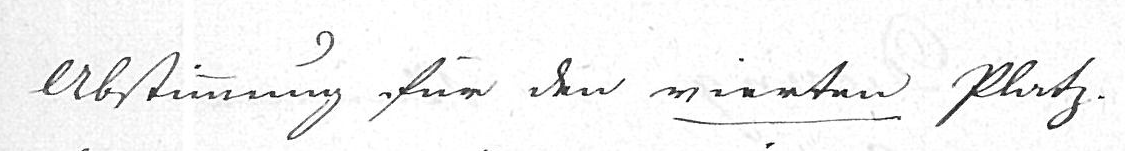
Abstimmung für den vierten Platz.
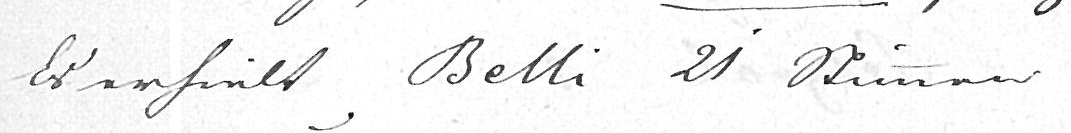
Es erhielt Belli 21 Stimmen
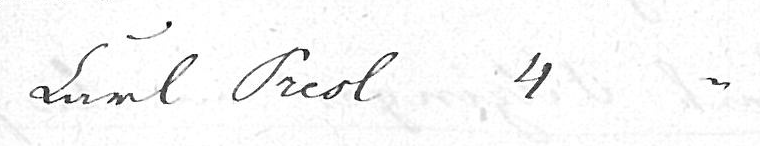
Carl Presl 4 "
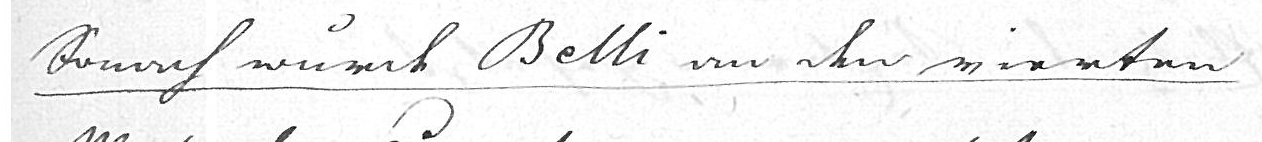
Sonach wurde Belli an den vierten
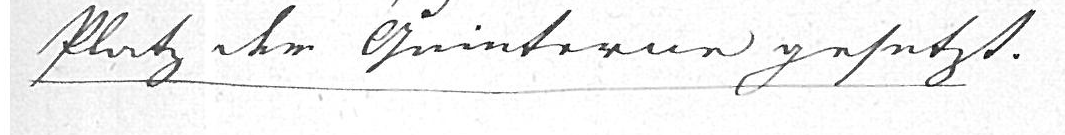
Platz der Quinterne gesetzt.
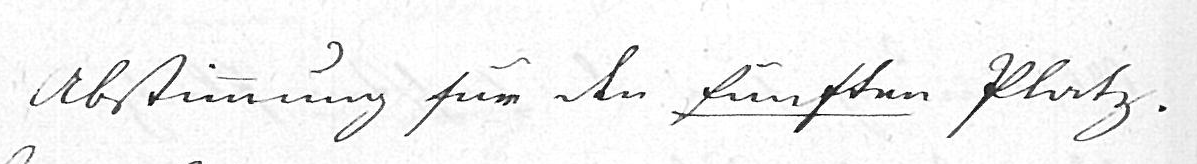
Abstimmung für den fünften Platz.
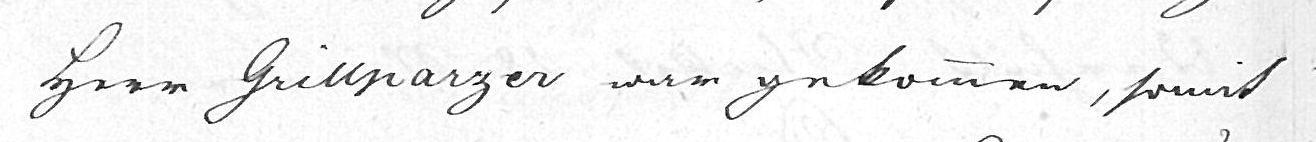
Herr Grillparzer war gekommen, somit
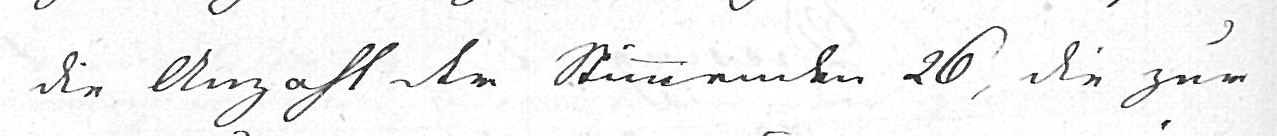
die Anzahl der Stimmenden 26, die zur
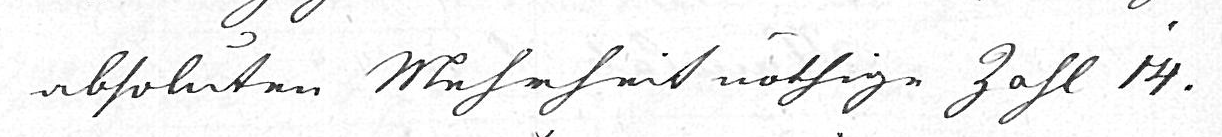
absoluten Mehrheit nöthige Zahl 14.
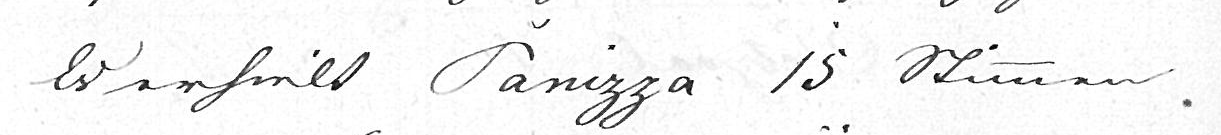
Es erhielt Panizza 15 Stimmen.
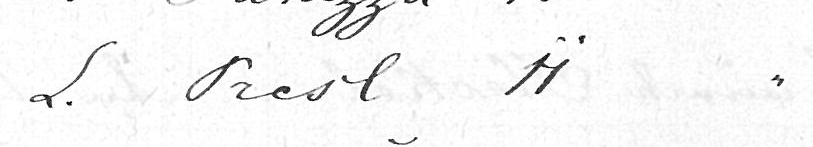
C. Presl 11 "
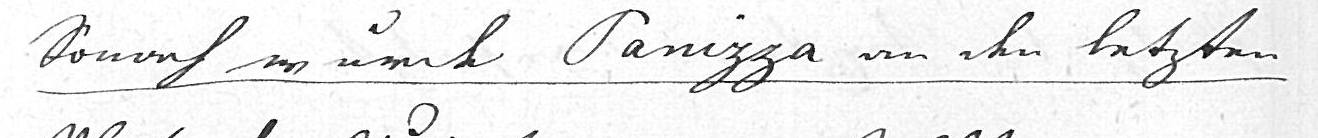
Sonach wurde Panizza an den letzten
